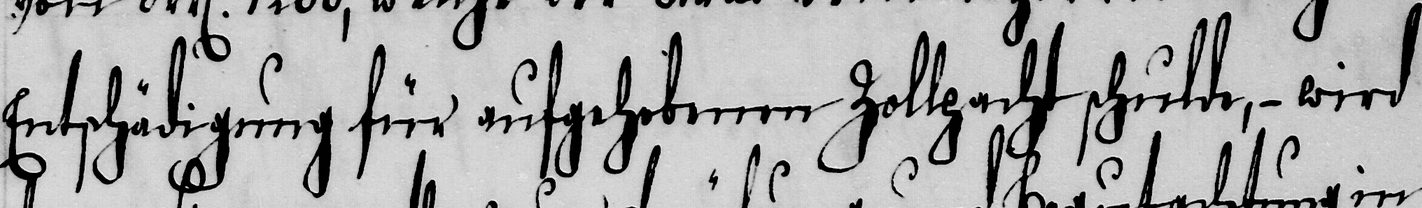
ntschädigung für aufgehobenen Zollpacht schulde,
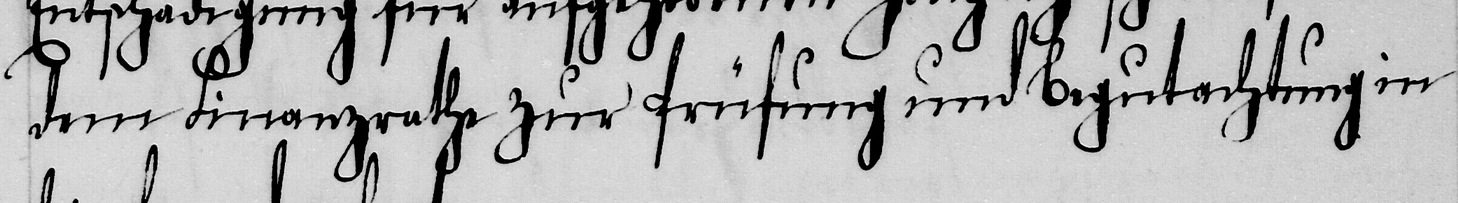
dem Finanzrathe zur Prüfung und Begutachtung in
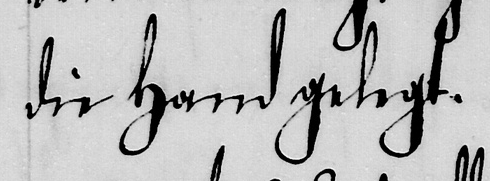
die Hand gelegt.
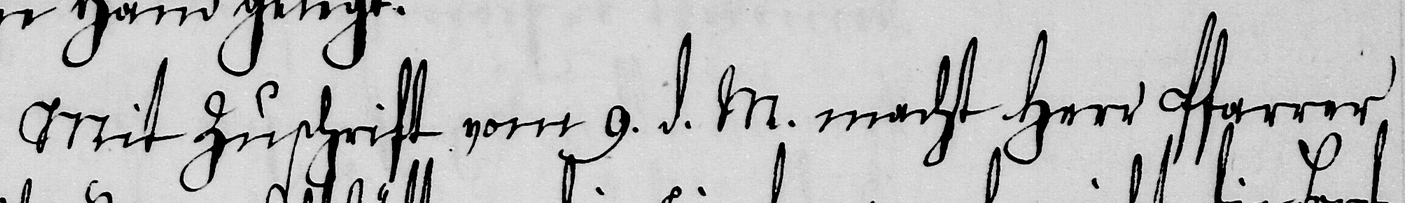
Mit Zuschrift vom 9. d. M. macht Herr Pfarrer
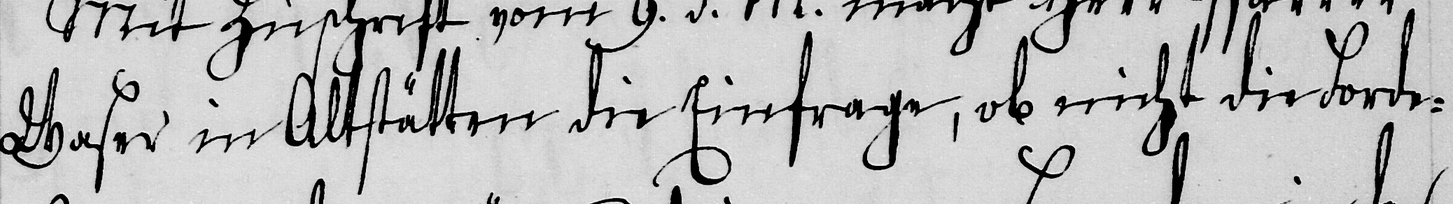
Waser in Altstätten die Einfrage, ob nicht die Forde¬
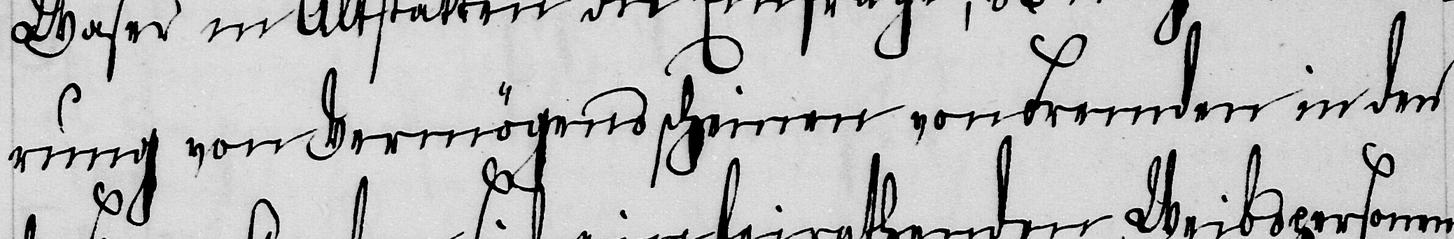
rung von Vermögensscheinen von Fremden in den
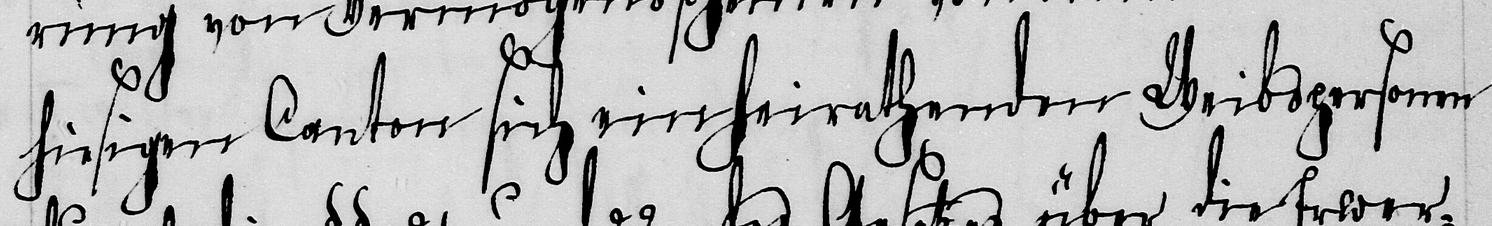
hiesigen Canton sich einheirathenden Weibspersonen
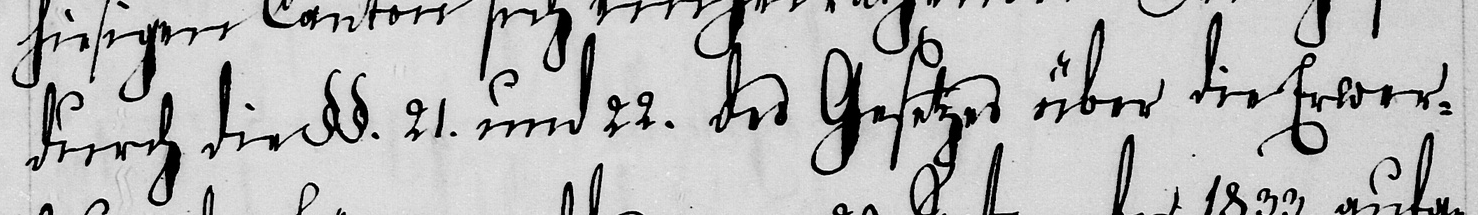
durch die §§. 21. und 22. des Gesetzes über die Erwer¬
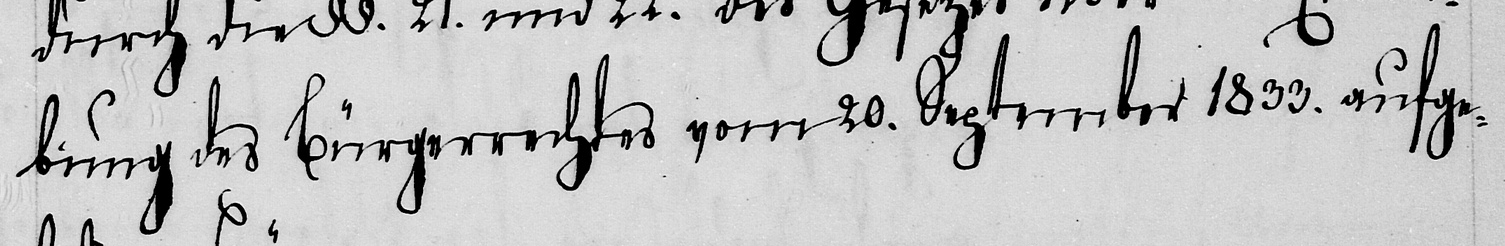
bung des Bürgerrechtes vom 20. September 1833. aufge¬
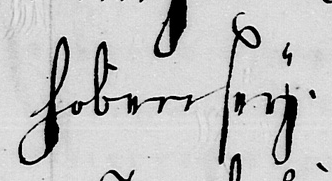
hoben sey.
